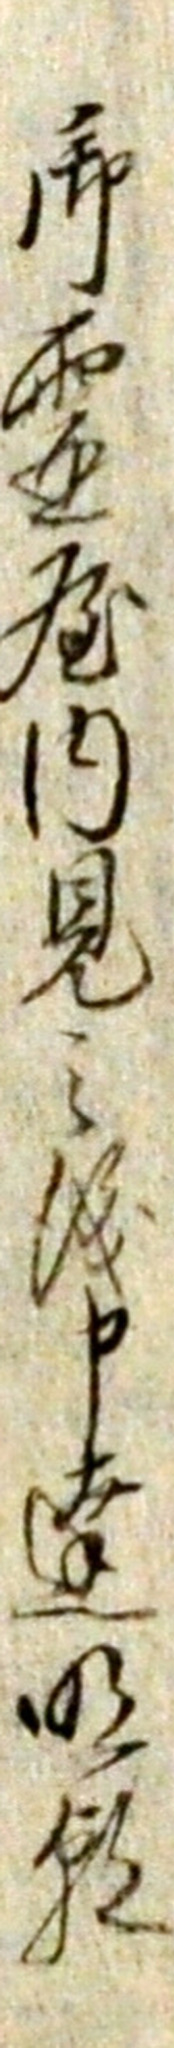御霊屋内見之申達明朝
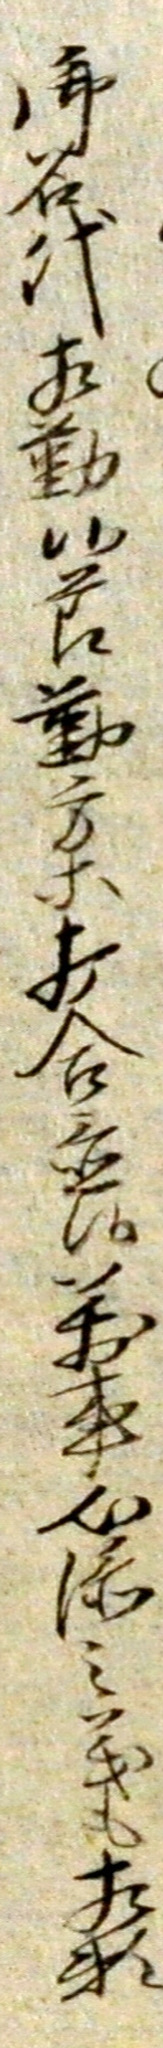御名代相勤候節勤方抔打合置候萬事心添之義相頼
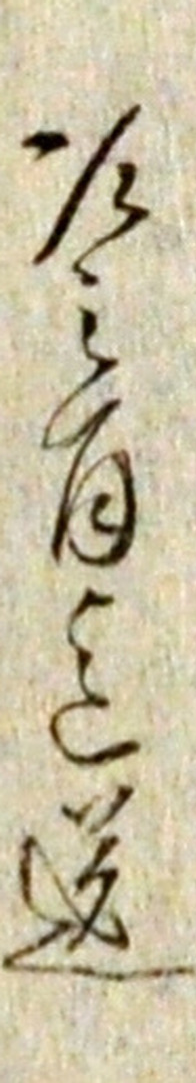次之間迄送
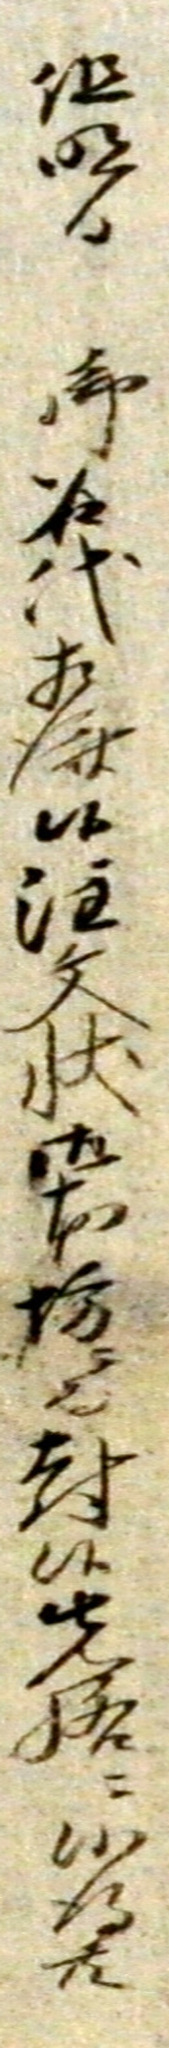但明日御名代相済候注文状御本坊ニ而封候先格二候得共
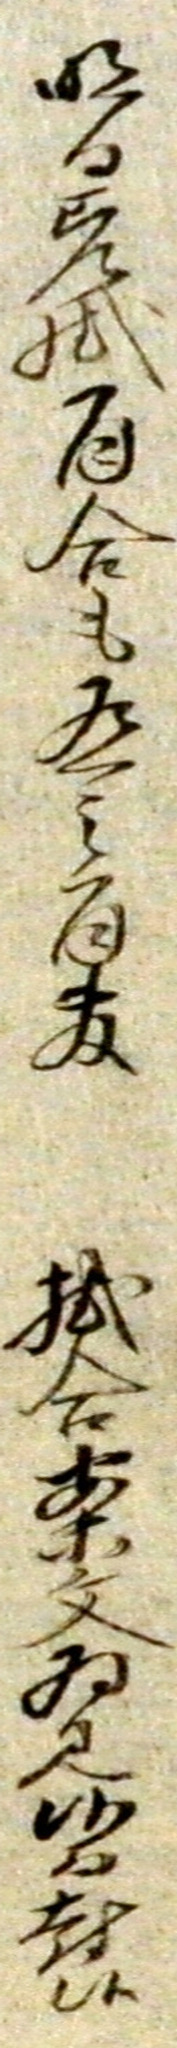明日差掛間合も有之間敷掛合案文為見候而封候
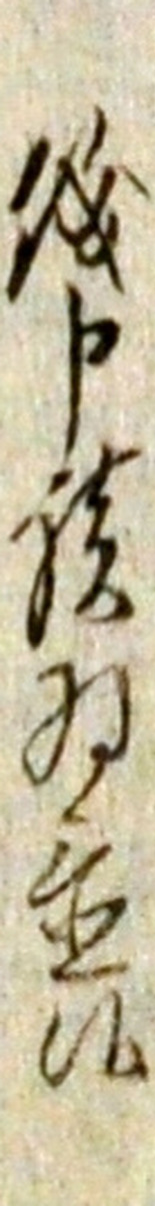儀申談為置候
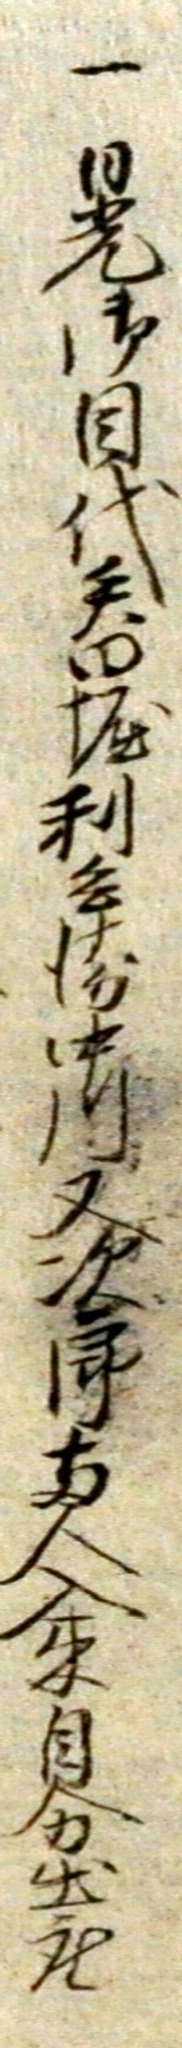一日光御目代番堀利兵衛中川又次郎両人入来自分出座
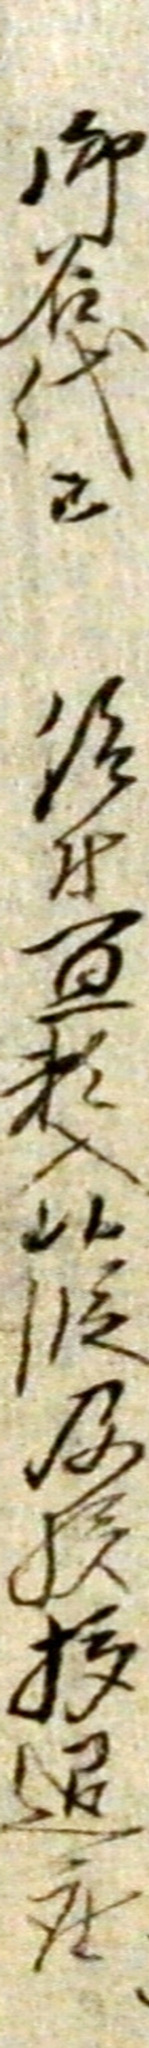御名代ヒ仰付宜頼入候段及挨拶退座
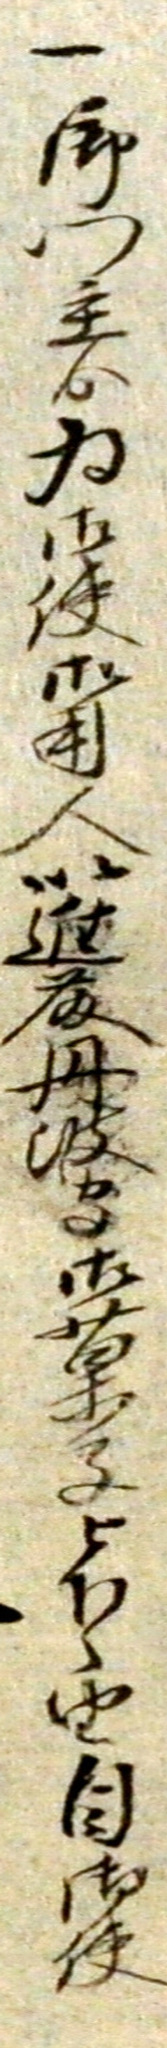一御門主ゟ為御使御用人以進藤丹波守御菓子ヒ下候由目御使
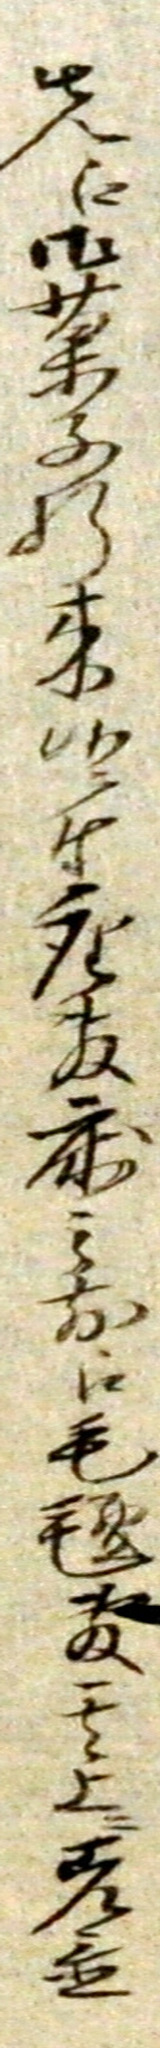先江御菓子折来候二付座敷床之江毛氈敷其上ニ差置
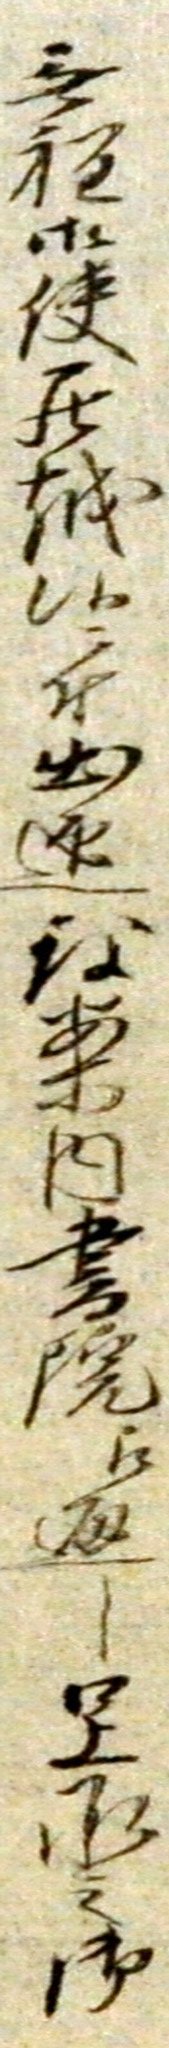無程御使罷越候ニ付出迎致案内書院江通し口上承之御
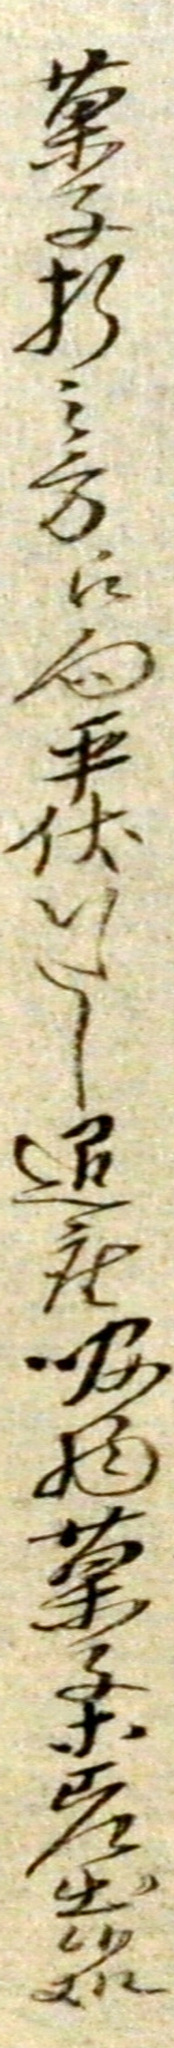菓子折之方江向平伏いたし退座吸物菓子抔差出候処
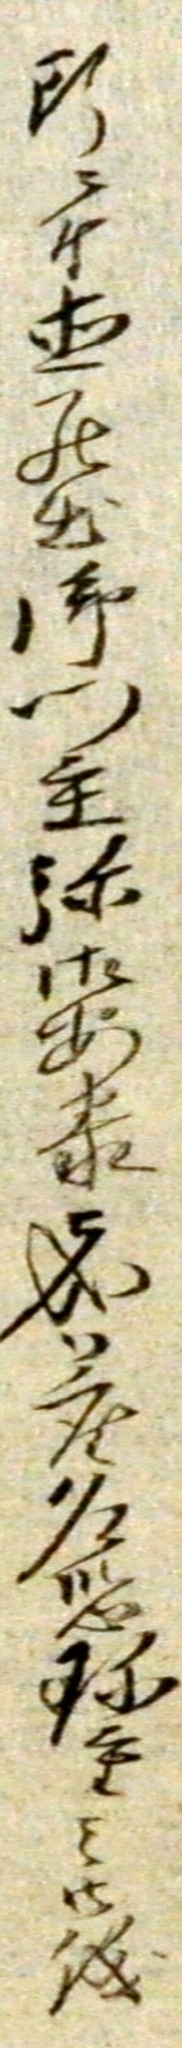断ニ付直罷出御門主弥御安泰被成御座乍恐珍重之御儀
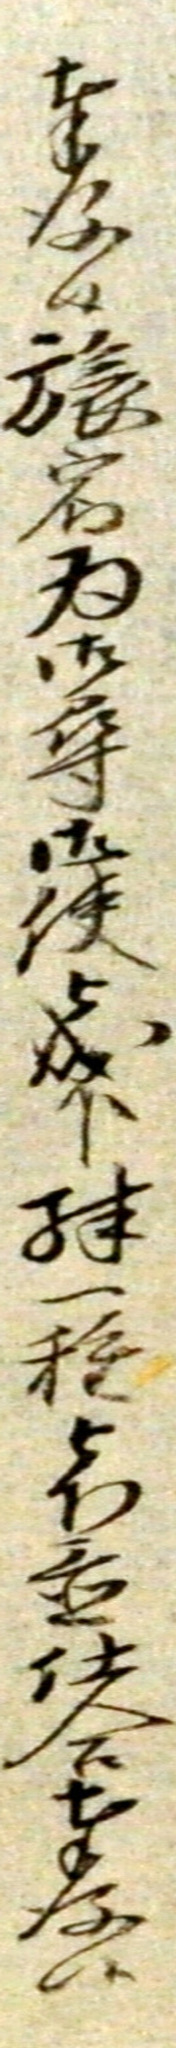奉存候旅宿為御尋御使ヒ成下秣一種ヒ下置仕合奉存候
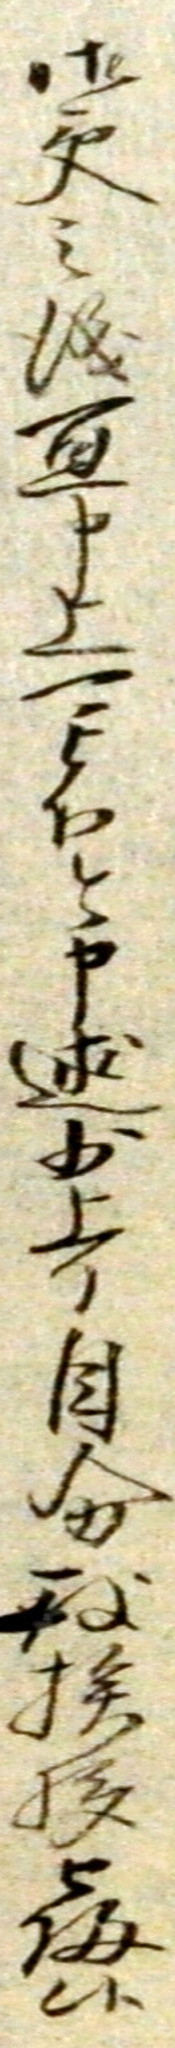御受之儀宜申上可ヒ下と申述少上り自分致挨拶ヒ帰候
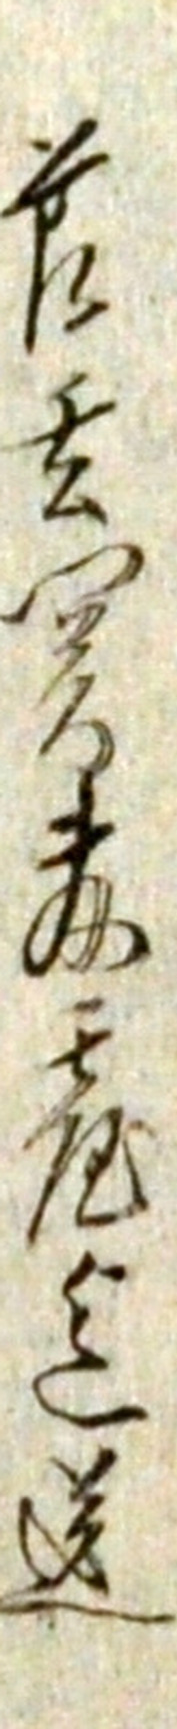節玄関敷臺迄送
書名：日光御名代相勤候節ノ留
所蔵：伊那市立高遠町図書館・合同会社AMANE
